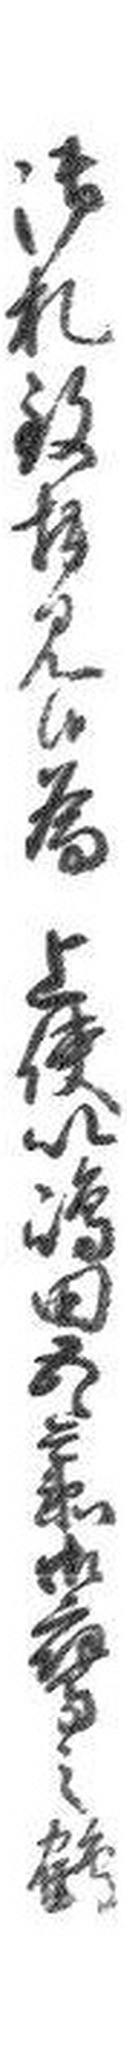御札致拝見候為上使以嶋田五郎兵衛御鷹之鶴
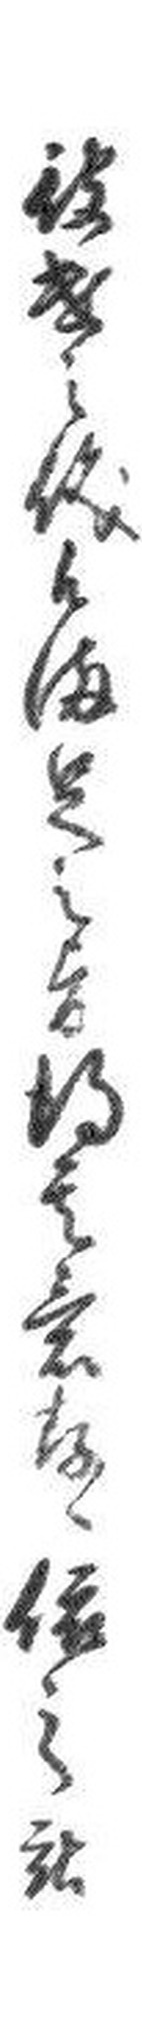被遣之儀御満足之旨得其意存候依之被
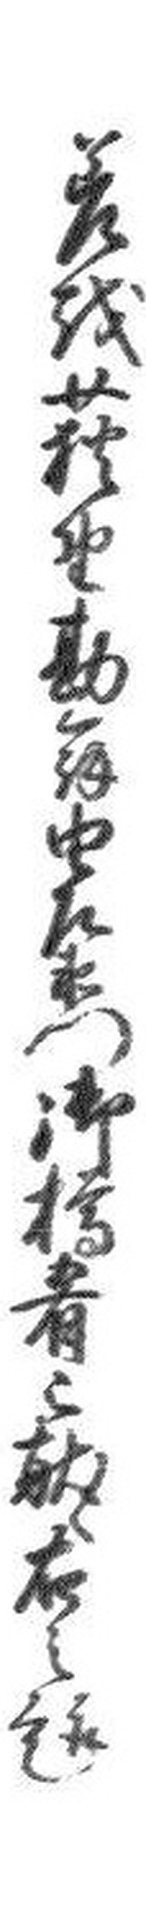差越荻野勘解由左衛門御樽肴被献候右之趣
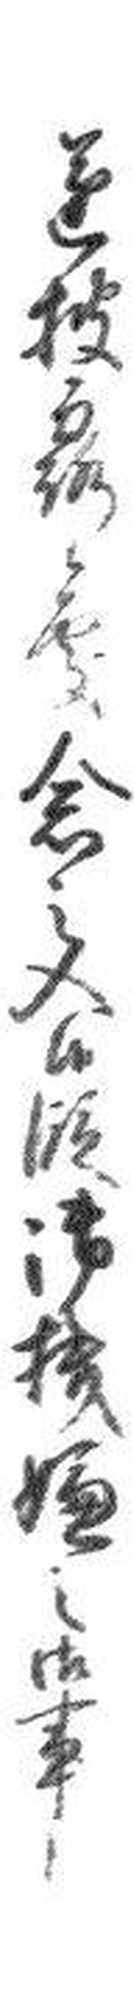遂披露候処念之入候段御機嫌之御事
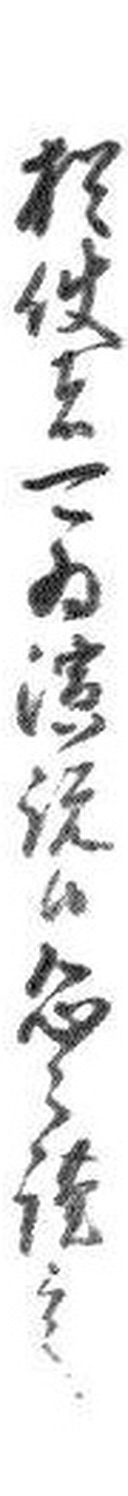猶使者可為演説候恐々謹言
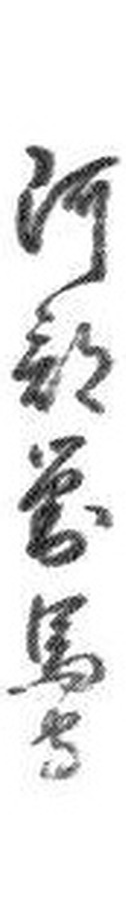阿部対馬守
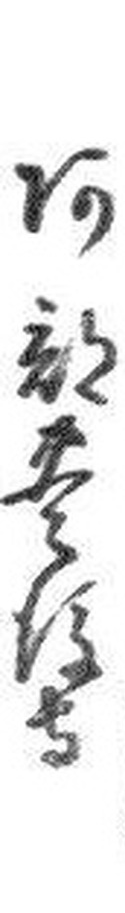阿部豊後守
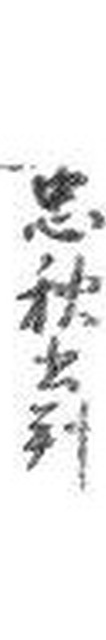忠秋書判
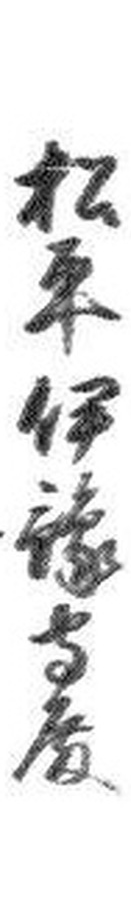松平伊予守殿

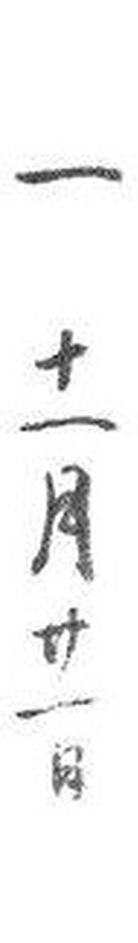一十一月廿一日
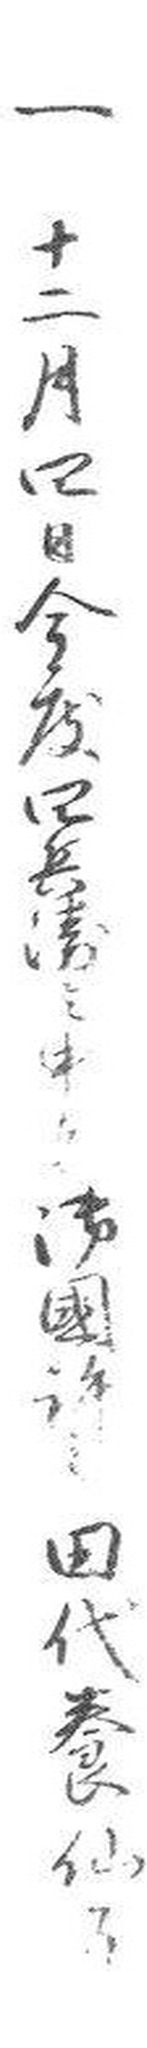一十二月四日今度四兵衛と申者御国許之田代養仙子
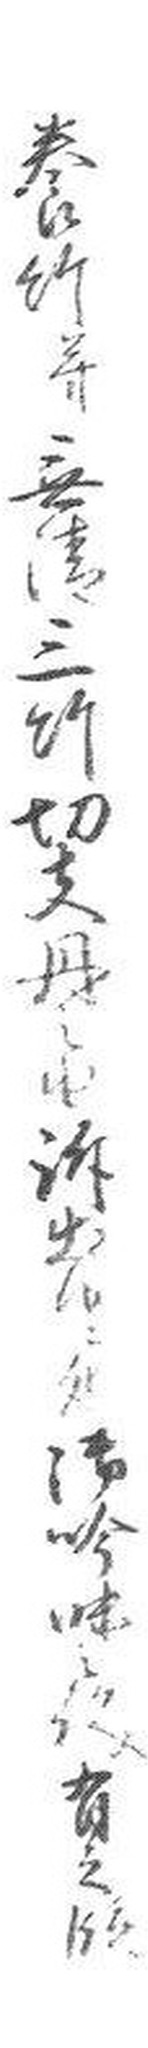養竹并無清三竹切支丹之由訴出候ニ付御吟味之儀有之段
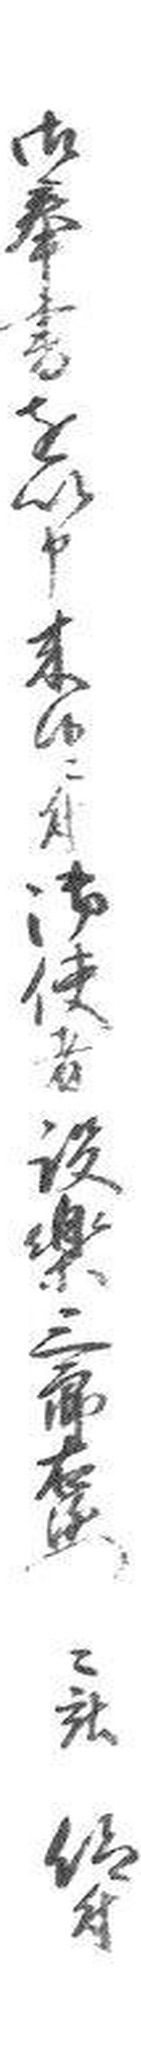御奉書を以申来候ニ付御使者設楽三郎右衛門ニ被仰付
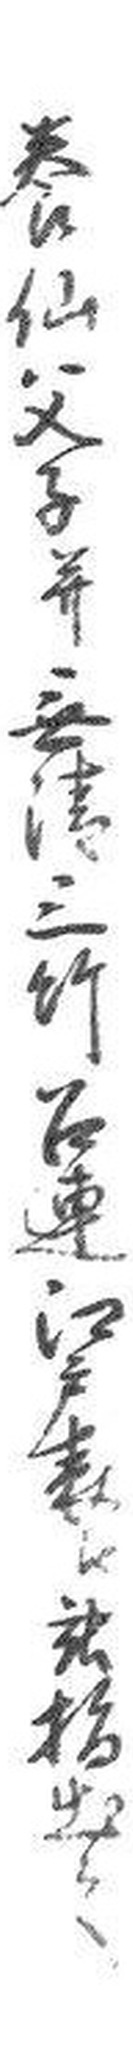養仙父子并無清三竹召連江戸表江被指出之
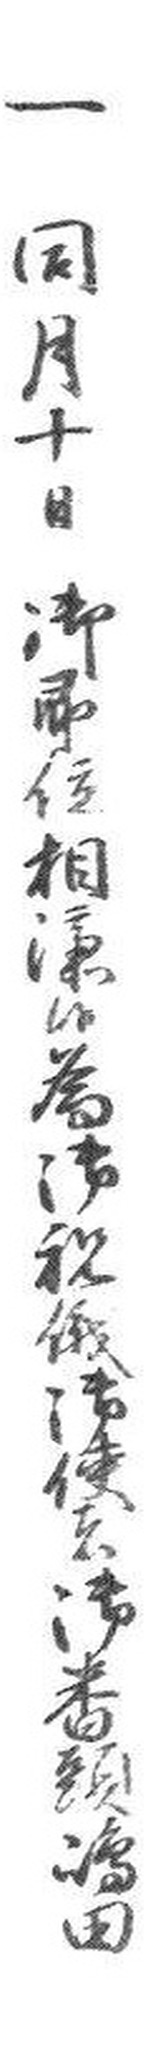一同月十日御即位相済候為御祝儀御使者御番頭嶋田
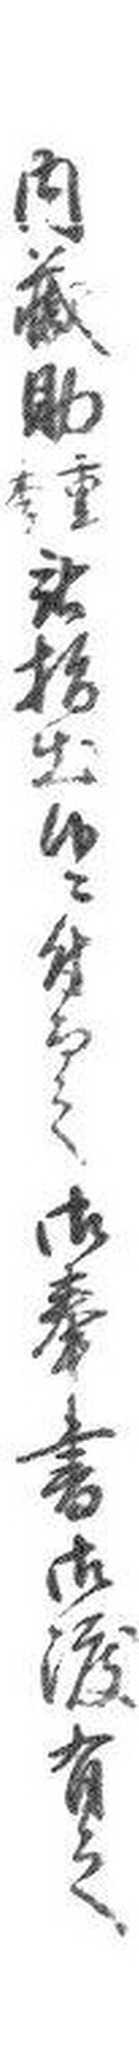内蔵助重季被指出候ニ付而之御奉書御渡有之
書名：家譜 四 忠昌公 従寛永七年到正保四年
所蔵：福井県文書館 Fukui Prefectural Archives
